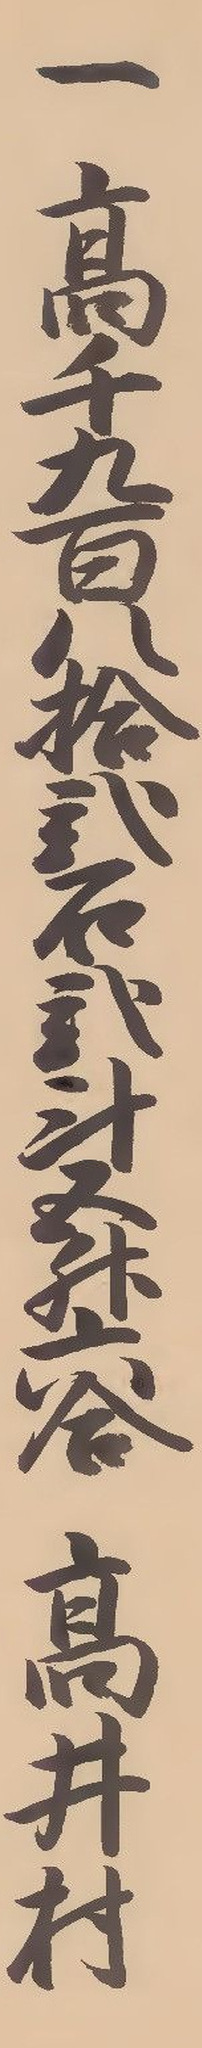一高千九百八拾弐石弐斗五升六合高井村

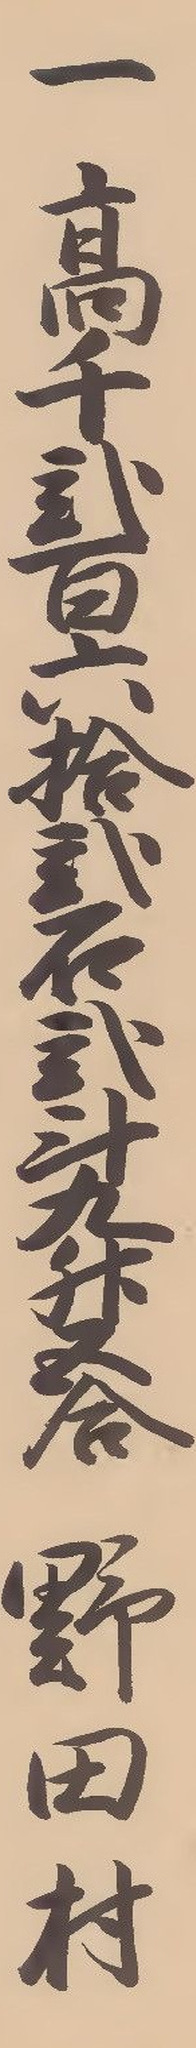一高千弐百六拾弐石弐斗九升五合野田村
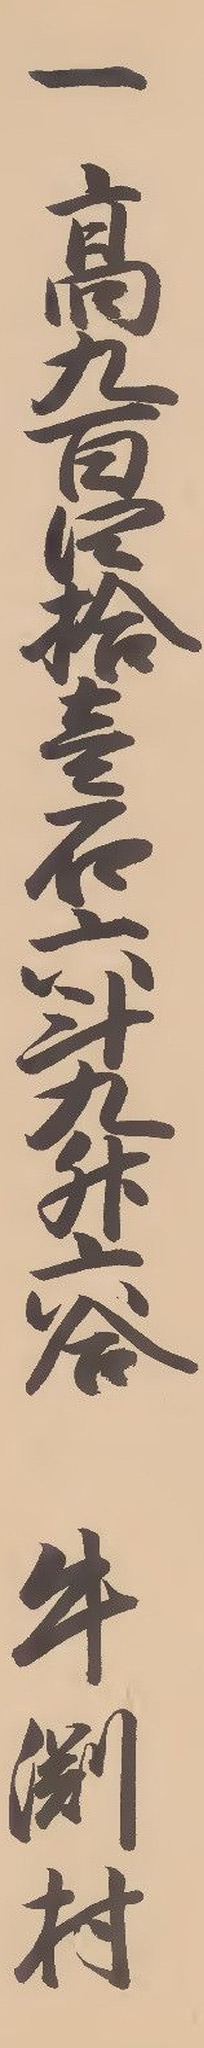一高九百四拾壱石六斗九升六合牛淵村
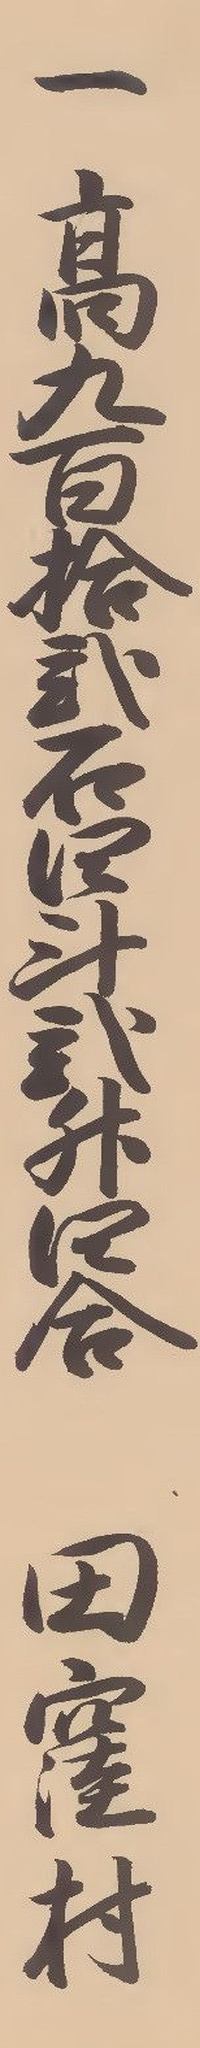一高九百拾弐石四斗弐升四合田窪村
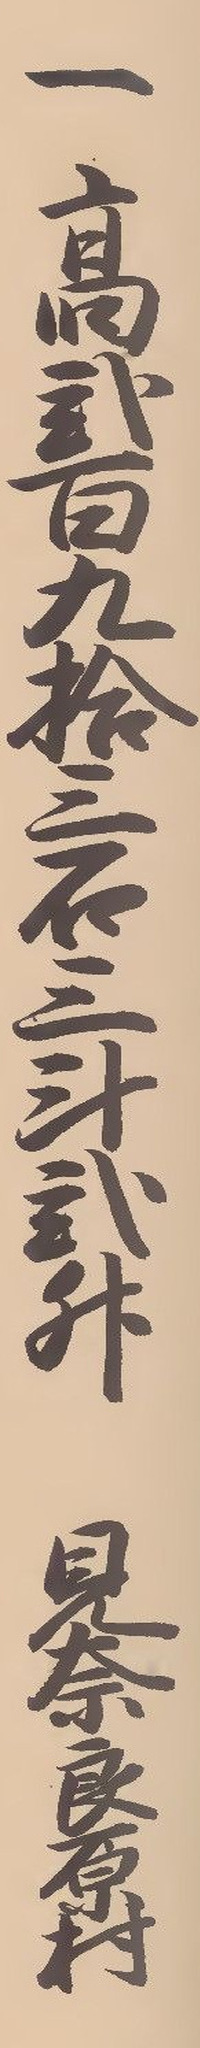一高弐百九拾三石三斗弐升見奈良原村
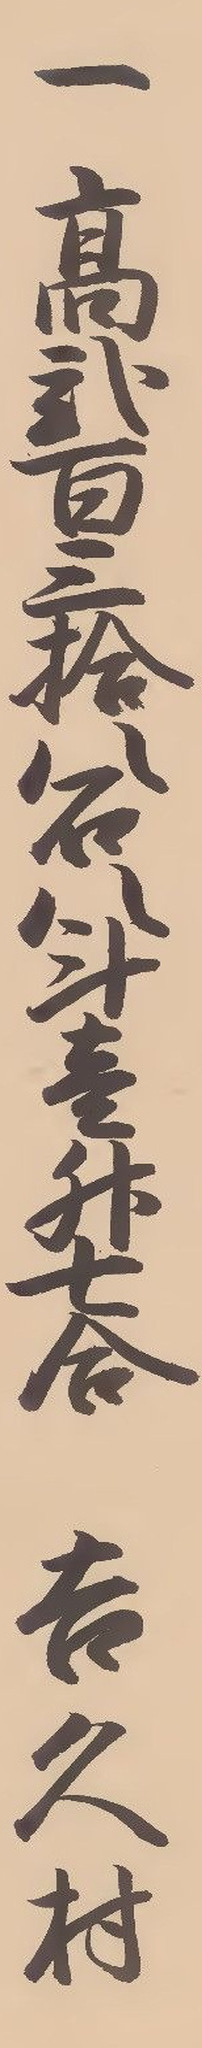一高弐百三拾八石八斗壱升七合吉久村
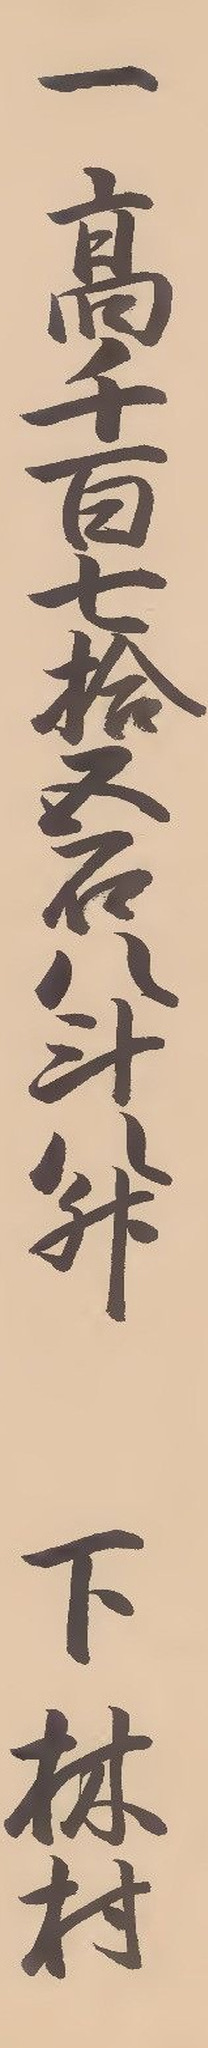一高千百七拾五石八斗八升下林村
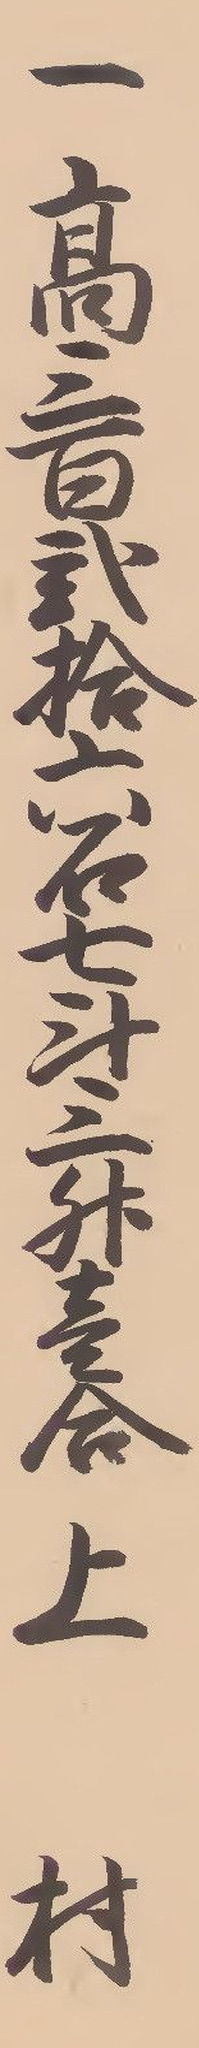一高三百弐拾六石七斗三升壱合上村

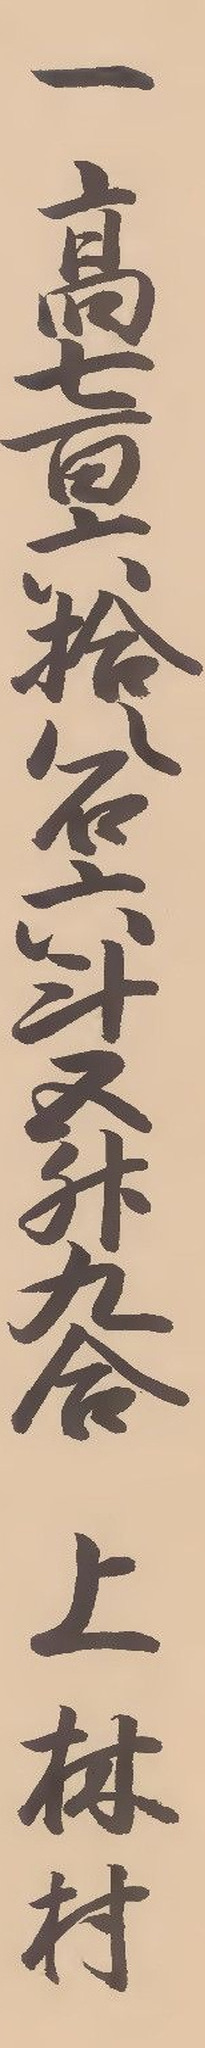一高七百六拾八石六斗五升九合上林村
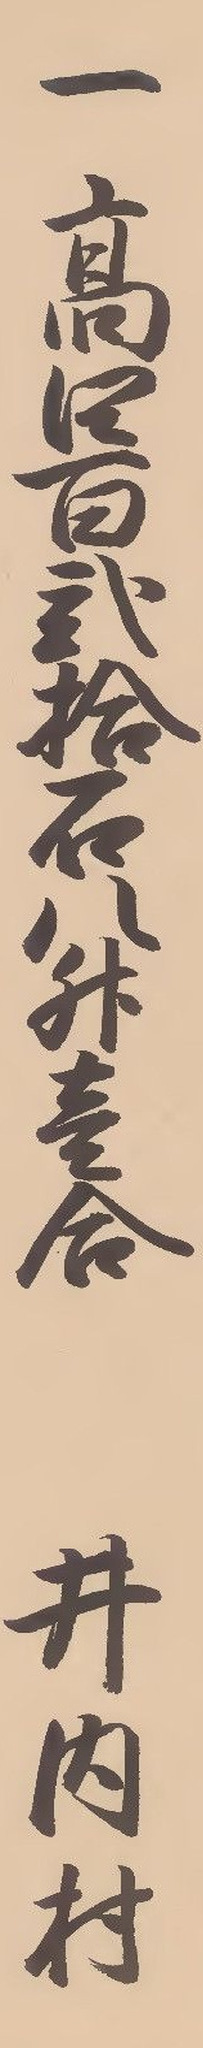一高四百弐拾石八升壱合井内村
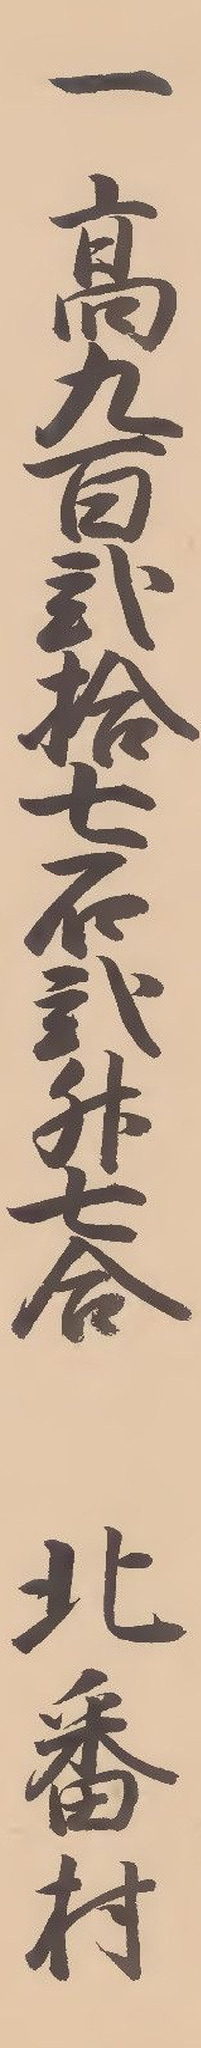一高九百弐拾七石弐升七合北番村
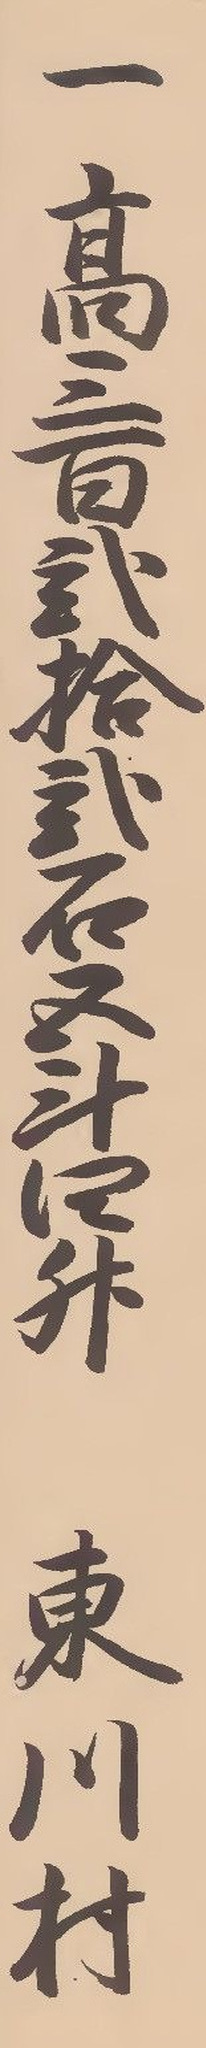一高三百弐拾弐石五斗四升東川村
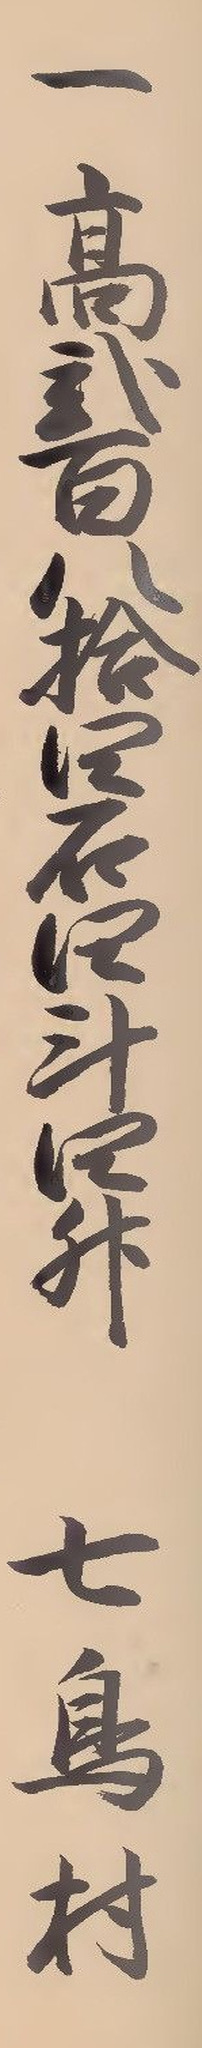一高弐百八拾四石四斗四升七鳥村
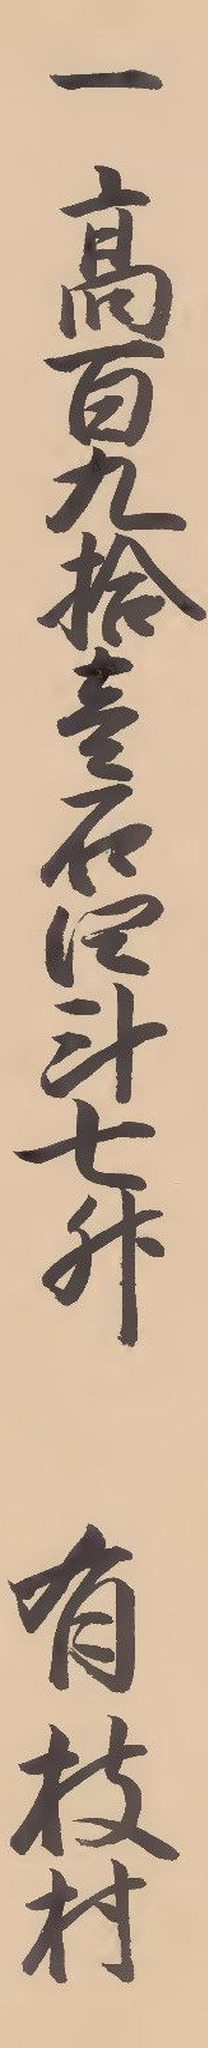一高百九拾壱石四斗七升有枝村
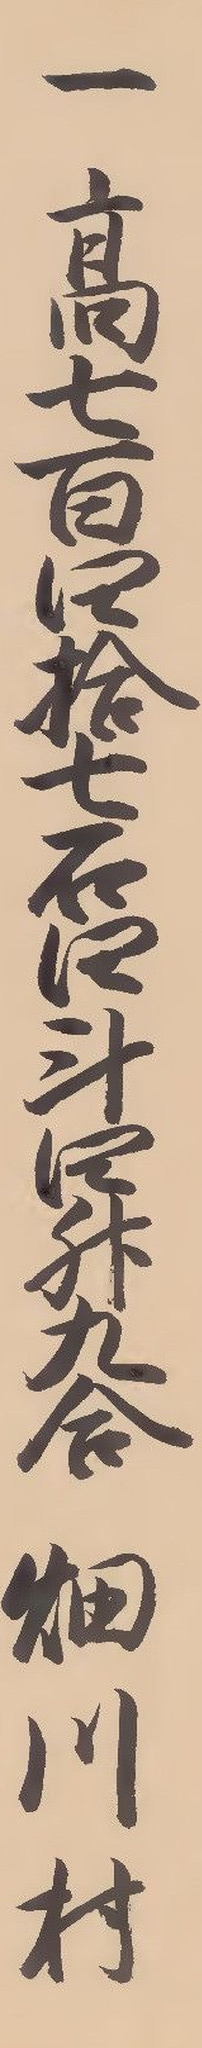一高七百四拾七石四斗四升九合畑川村
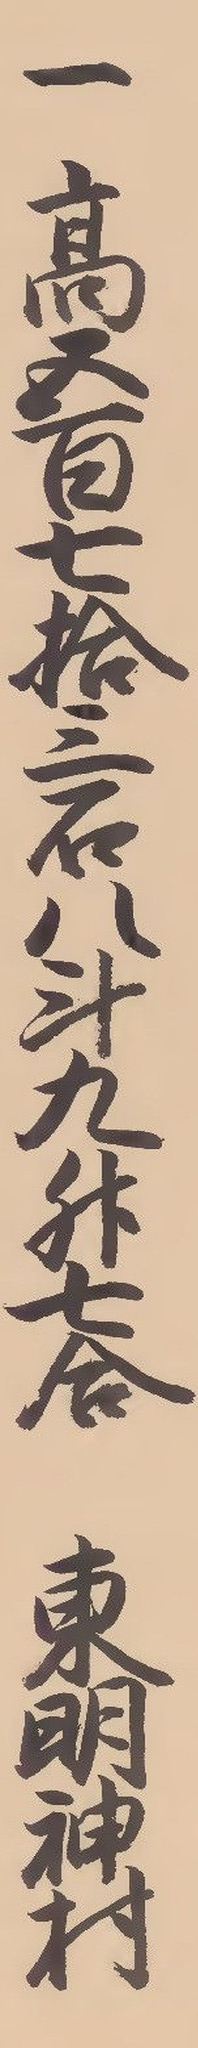一高五百七拾三石八斗九升七合東明神村
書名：伊予国郷帳
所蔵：国立公文書館 National Archives of Japan
